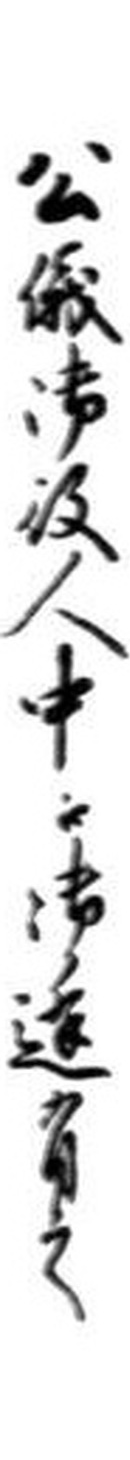公儀御役人中江御逢有之
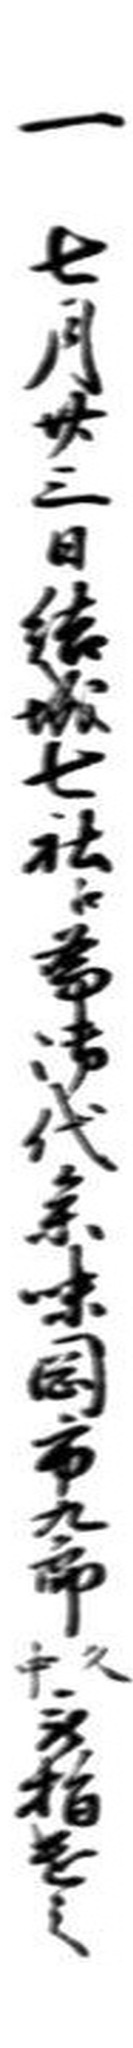一七月廿三日結城七社江為御代参味岡市九郎久中被指遣之
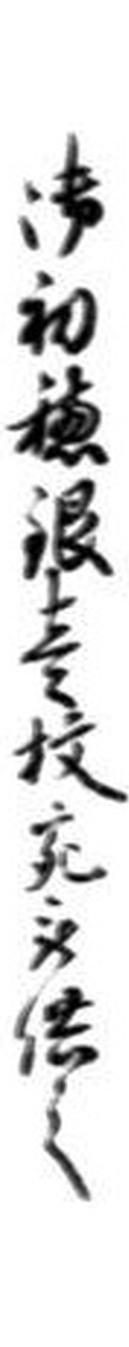御初穂銀壱枚宛被供之
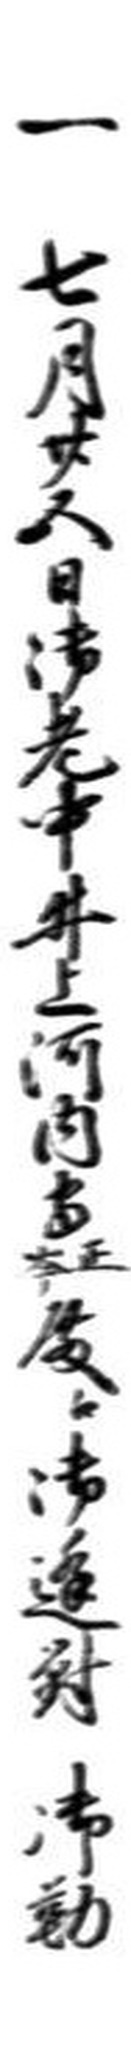一七月廿五日御老中井上河内守正岑殿江御逢対御勤
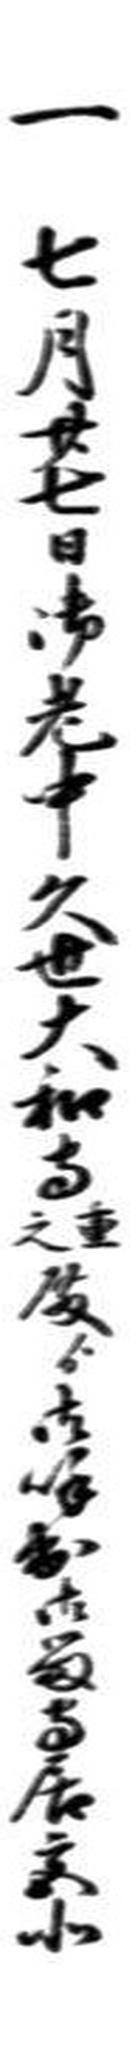一七月廿七日御老中久世大和守重之殿ゟ御呼出御留守居宮北
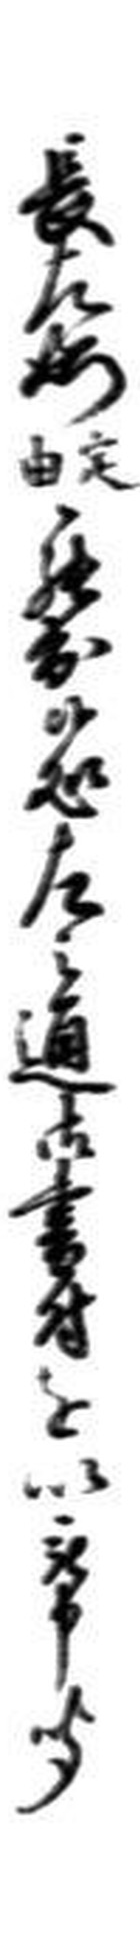長左衛門定由罷出候処左之通御書付を以被申聞
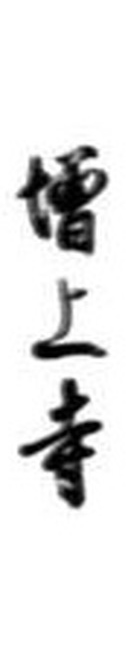増上寺
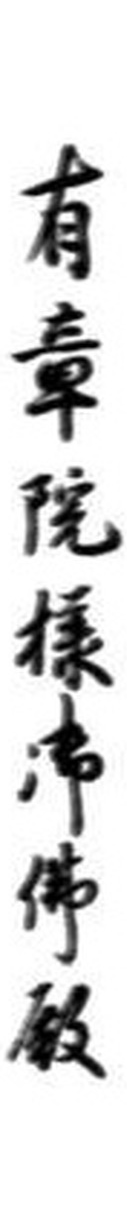有章院様御仏殿

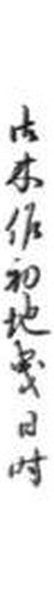御木作初地曳日時
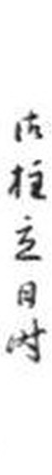御柱立日時
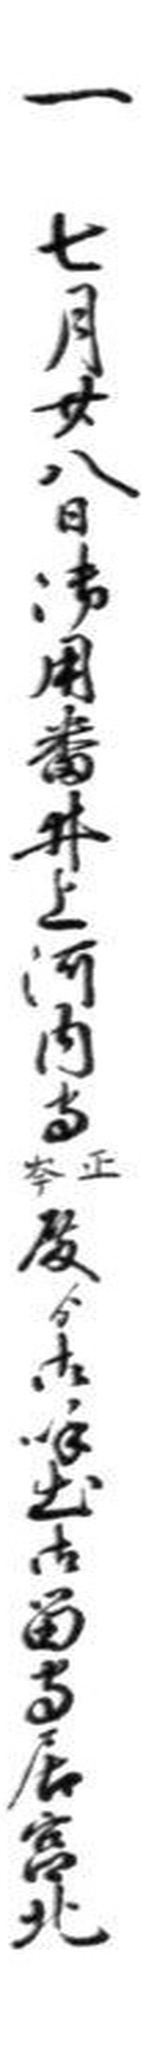一七月廿八日御用番井上河内守正岑殿ゟ御呼出御留守居宮北
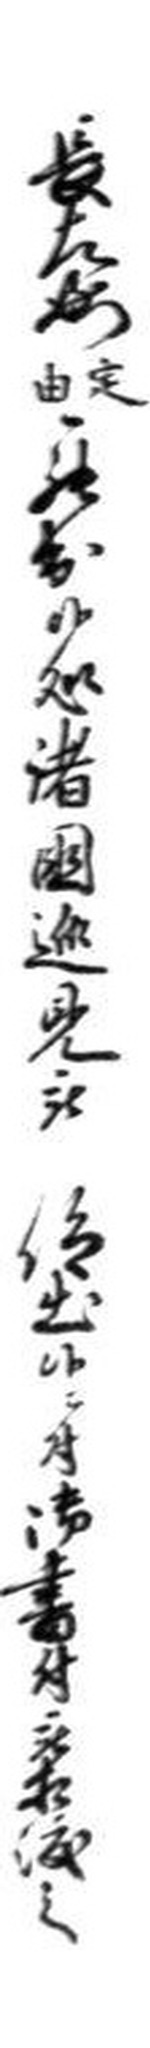長左衛門定由罷出候処諸国巡見被仰出候ニ付御書付被相渡之
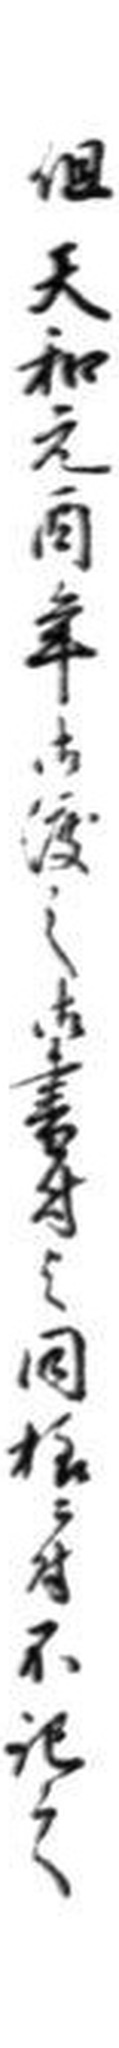但天和元酉年御渡之御書付と同様ニ付不記之
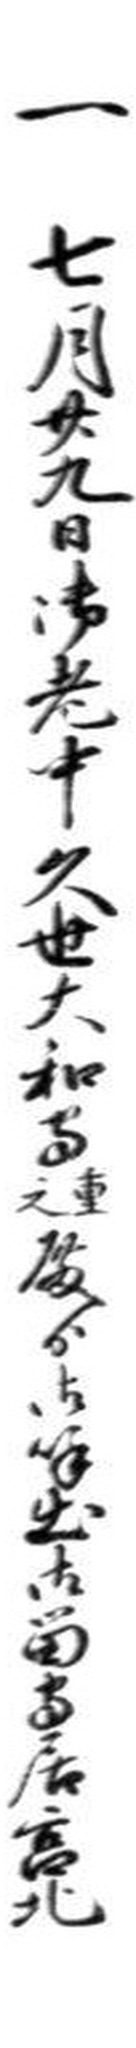一七月廿九日御老中久世大和守重之殿ゟ御呼出御留守居宮北
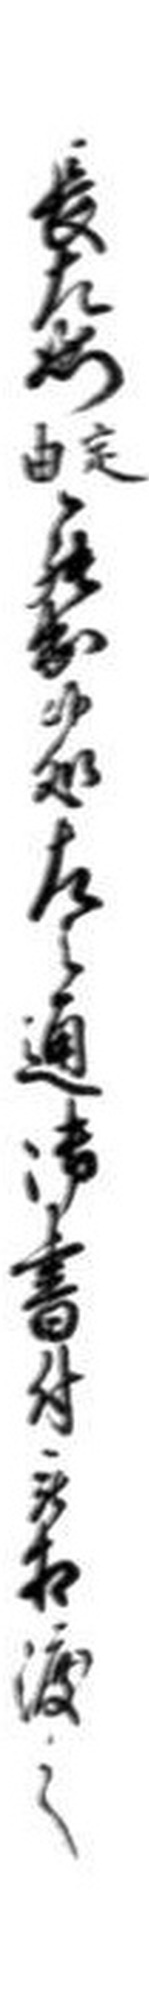長左衛門定由罷出候処左之通御書付被相渡之
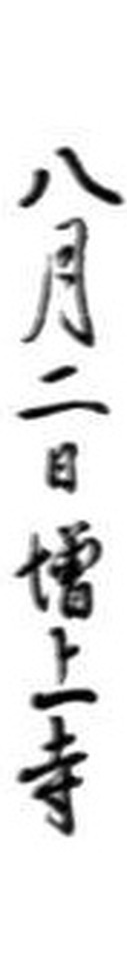八月二日増上寺
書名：家譜 三十一 吉邦公 享保元年
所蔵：福井県文書館 Fukui Prefectural Archives
